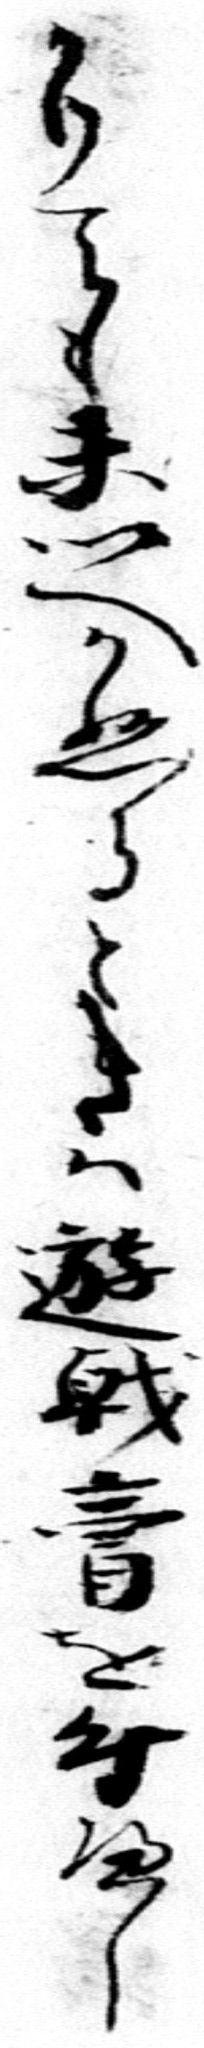かりても未いへかぬるときは遊戟膏を付へし
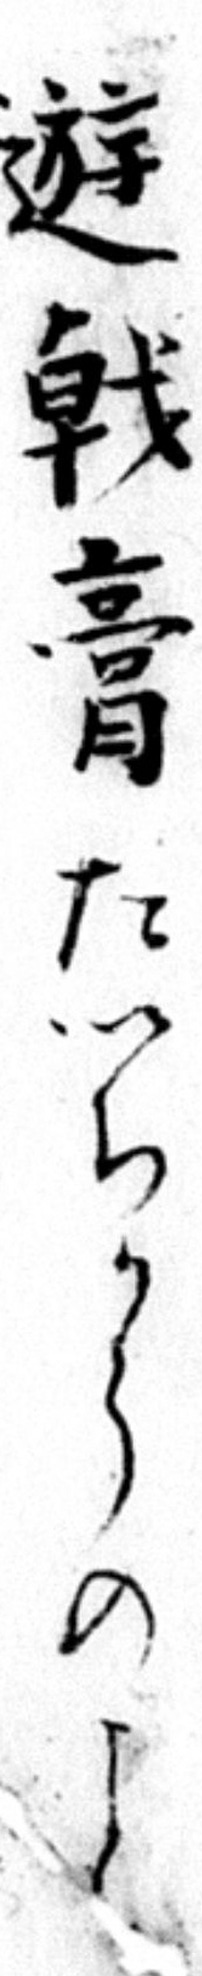遊戟膏たいちかうのこと
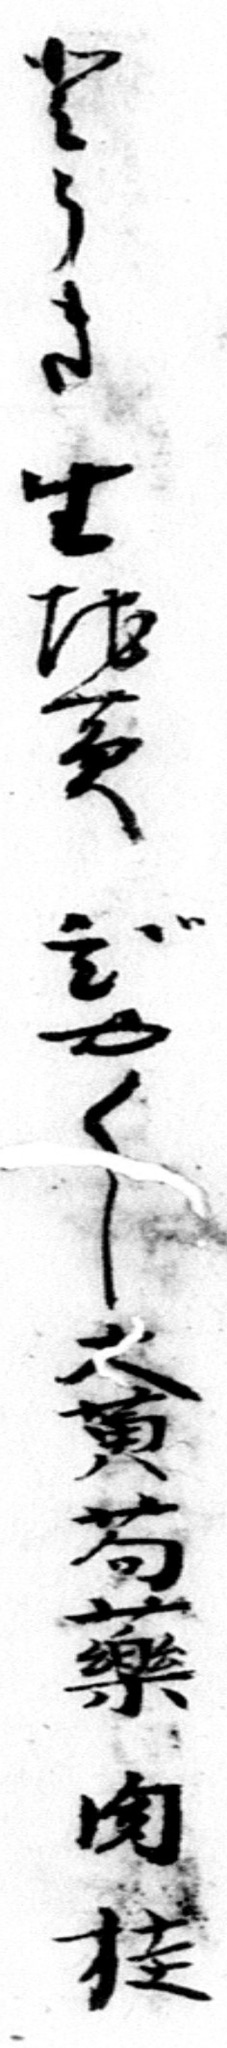とうき生地黄びやくし大黄苟薬肉桂
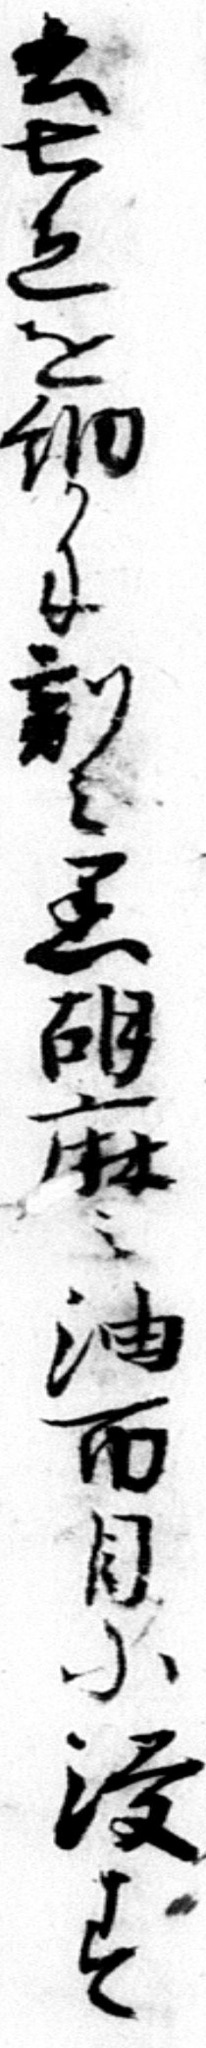右七点を細かに刻み黒胡麻の油百目に浸す
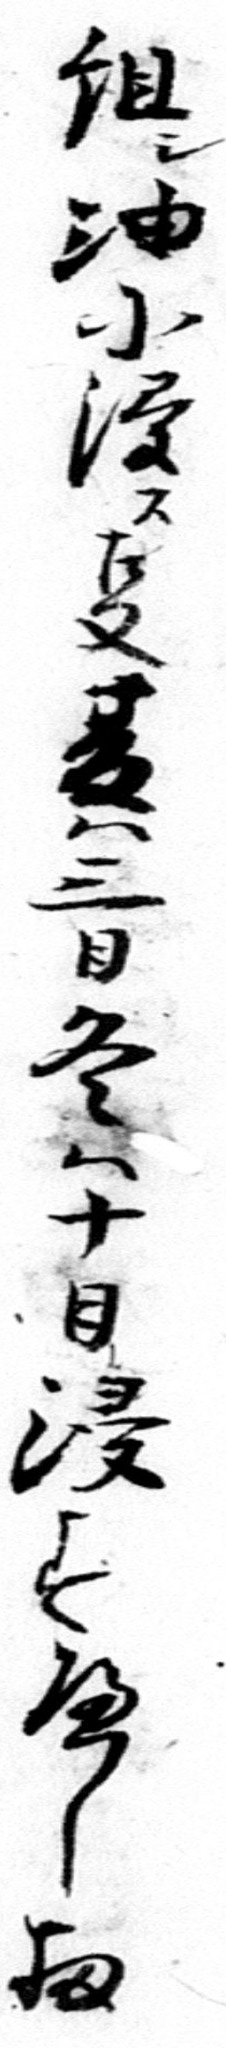但し油に浸す事夏は三目冬は十目浸すへし扨
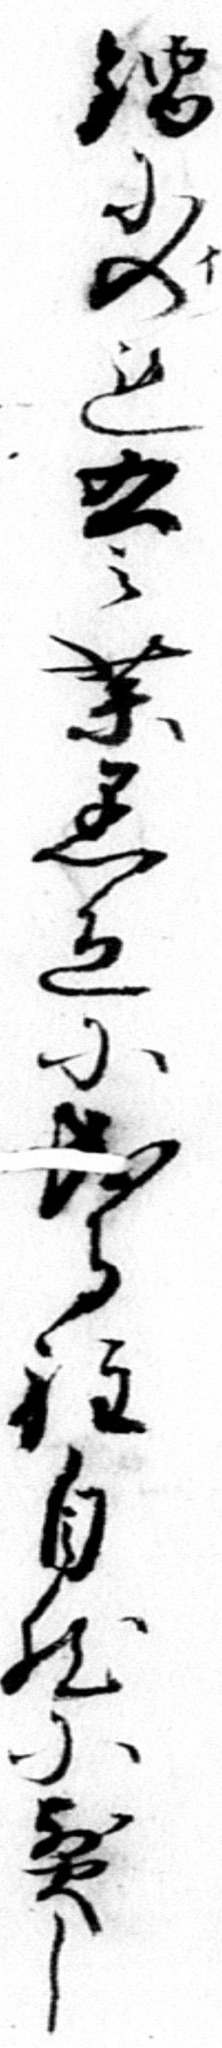鍋に入れ右の薬黒色に成る程自然に煎し
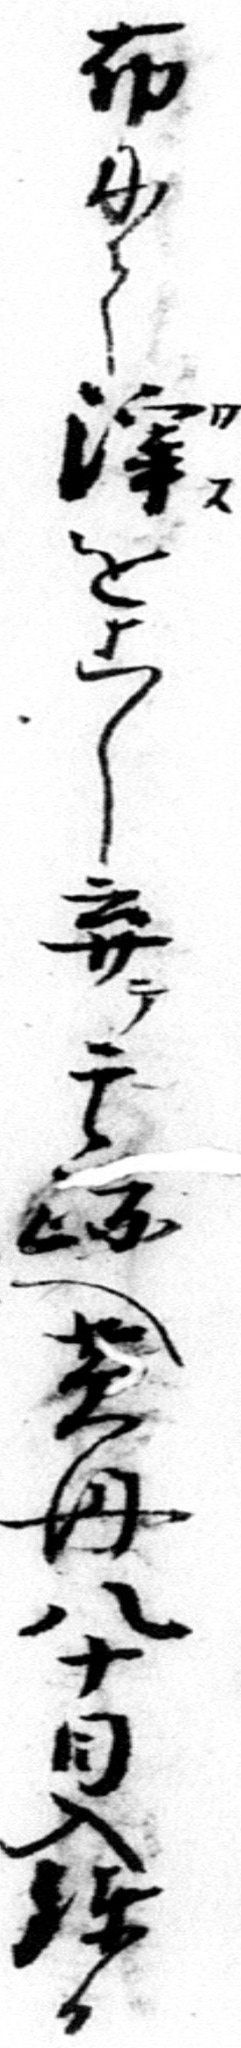布にて滓をこし棄て其跡へ青丹八十目入錬る
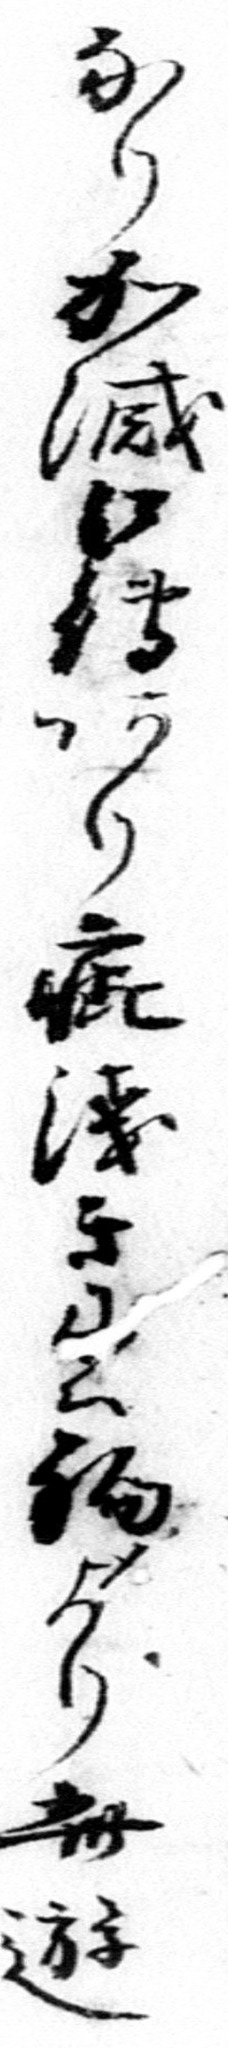なり加減口伝あり疵浅きには初此遊
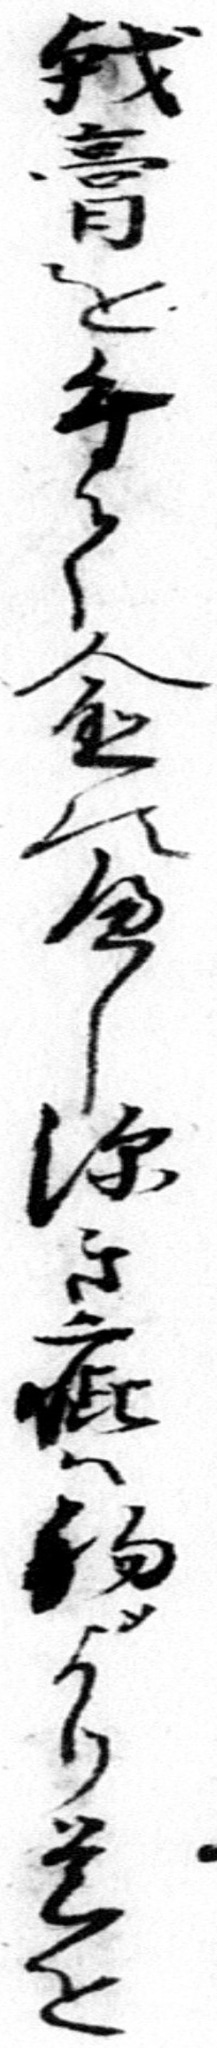戟膏を付て癒すへし深き疵は初是を
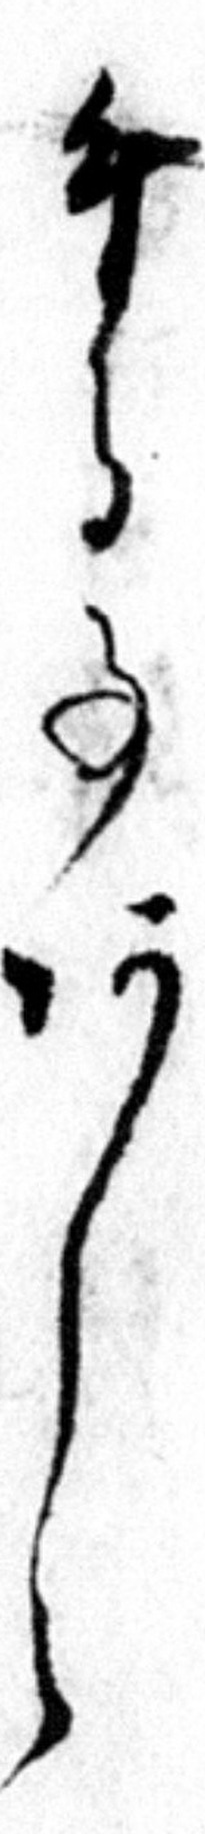付る事あしゝ
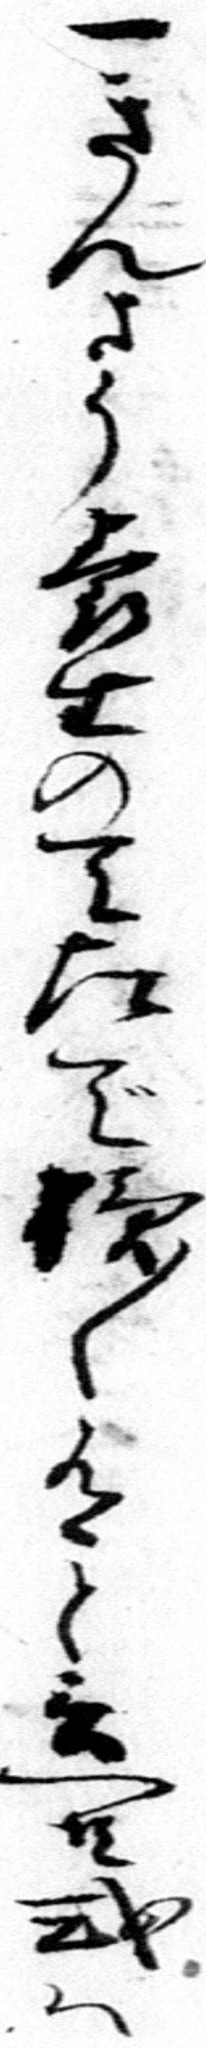一きんさう養生のてたで様〳〵有と云へ共或は
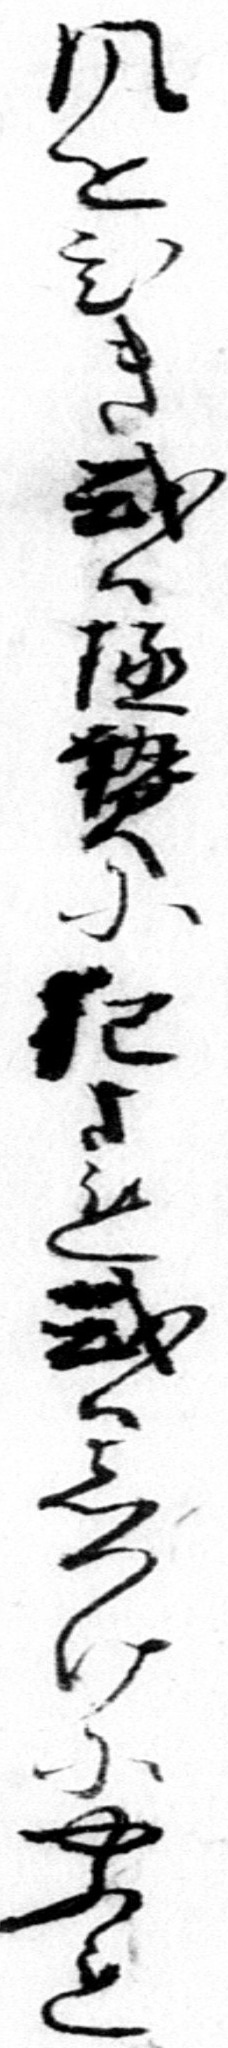風をひき或は極熱に犯され或はしつけにやふれ
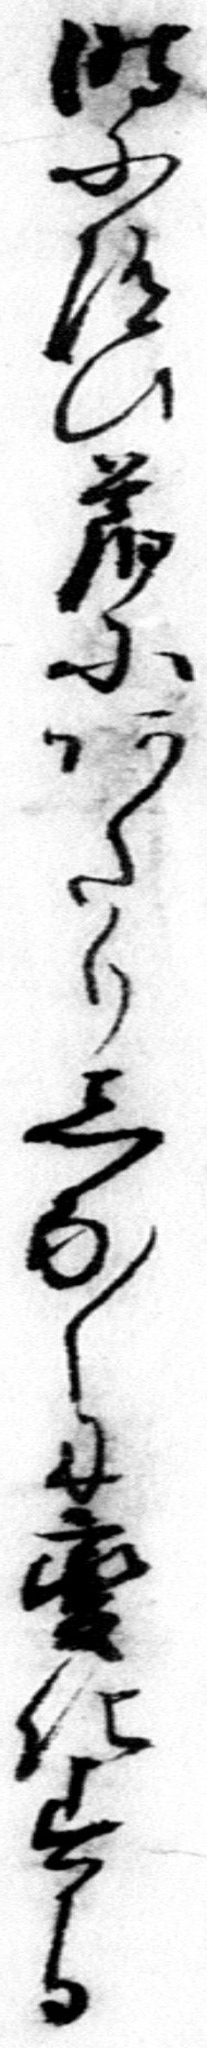時に陏ひ着にあたりしな〳〵に変化する
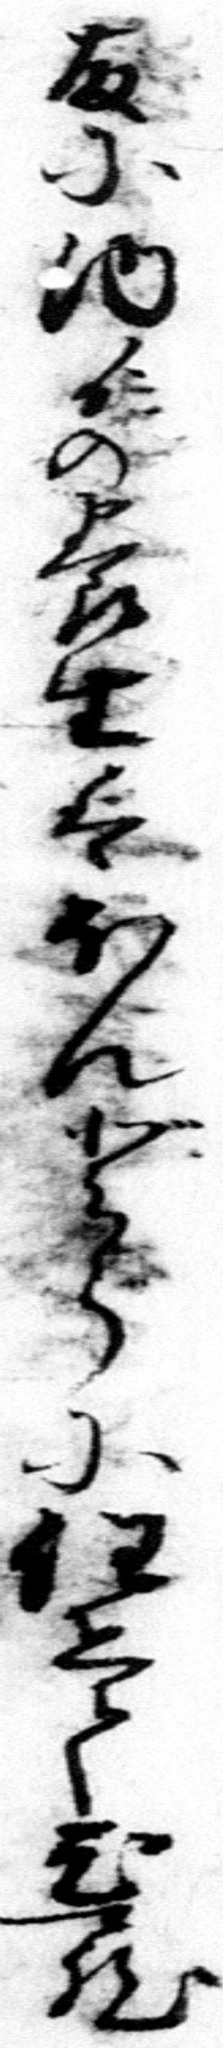故に内ゟの養生はほんどうに任せて尤可然

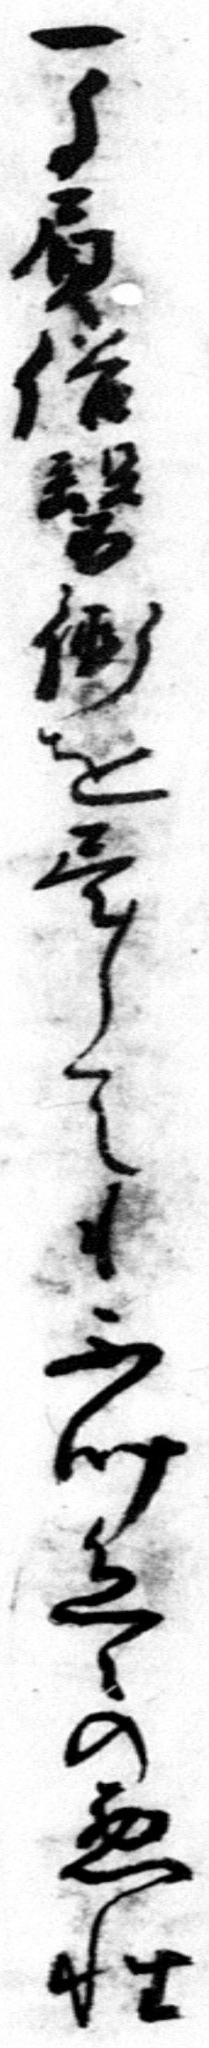一手屓俗医術を尽しても不叶色々の悪性
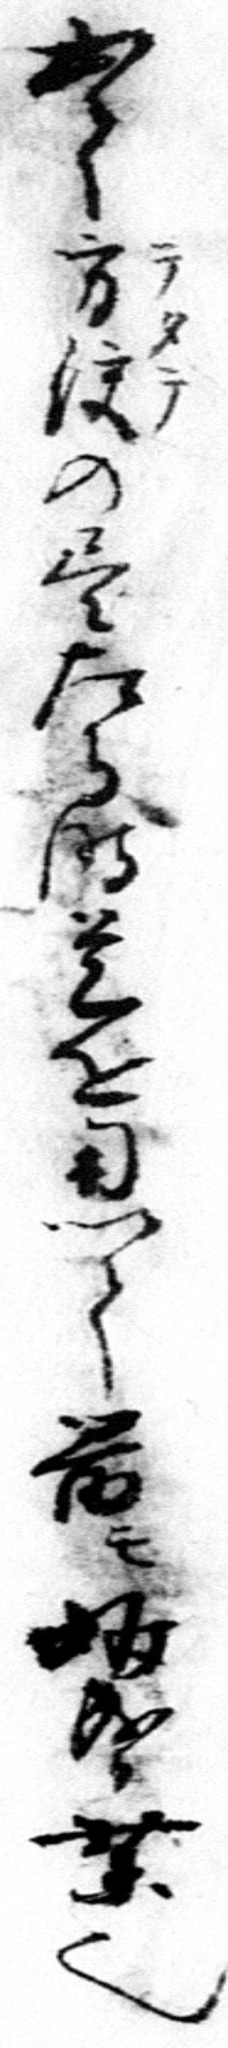出て方便の尽たる時是を用いて最も妙成る薬也
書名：名薬秘伝之書
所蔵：徳島県立図書館
